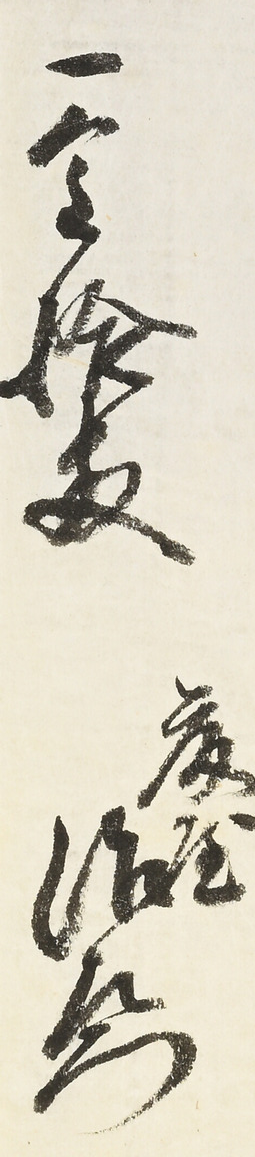一金拾両治左衛門
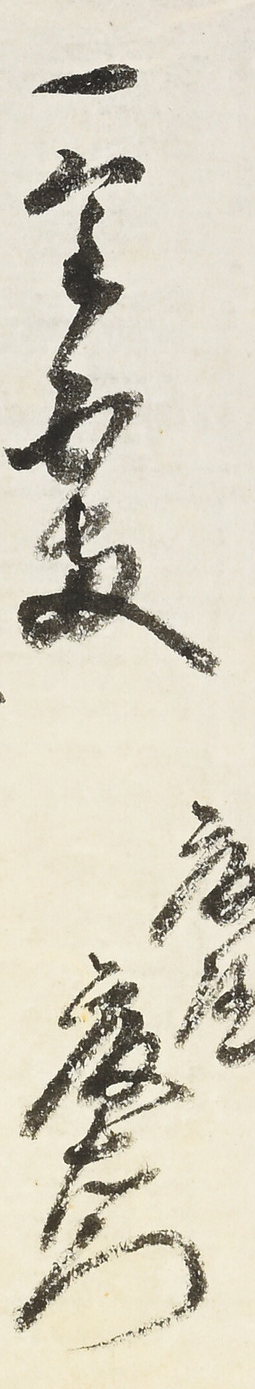一金五両藤右衛門
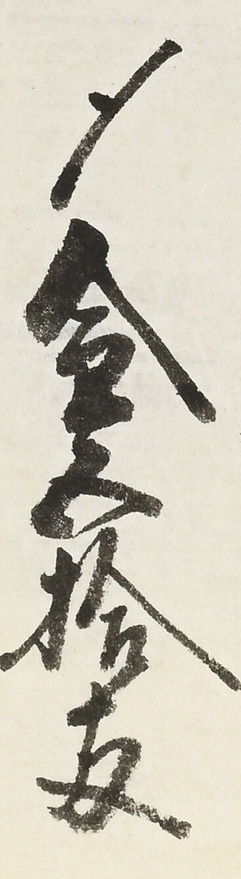〆金五拾両

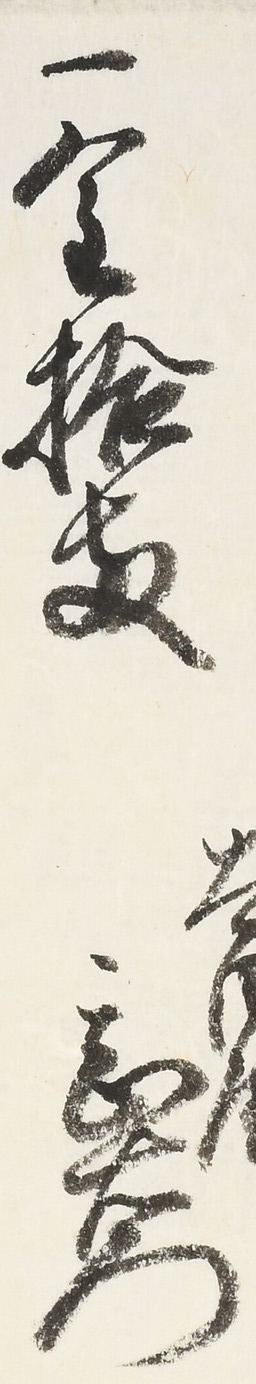一金拾両甚右衛門
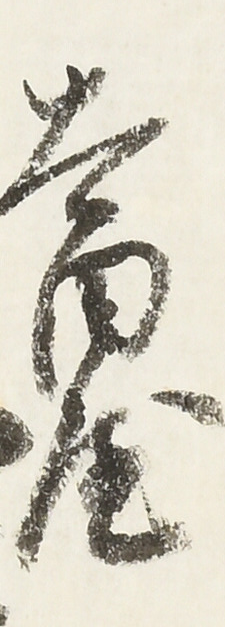太田屋
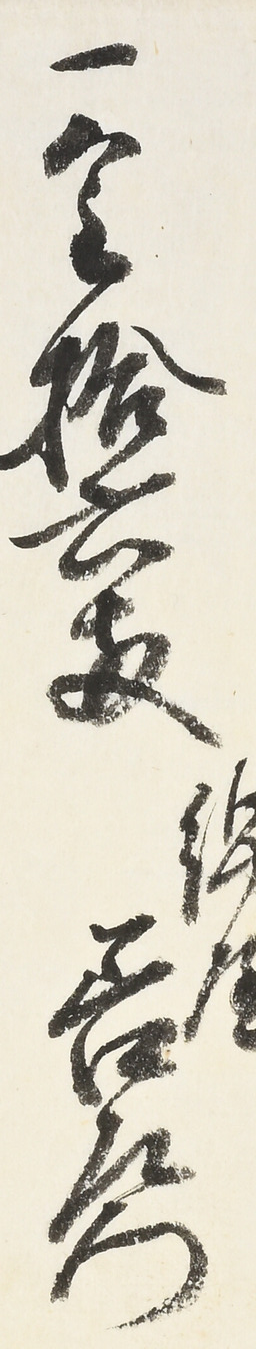一金拾六両善左衛門
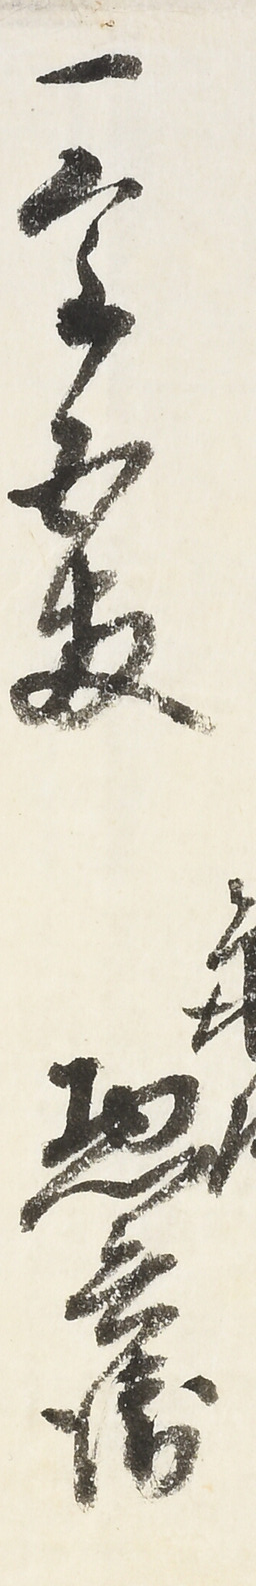一金五両惣兵衛
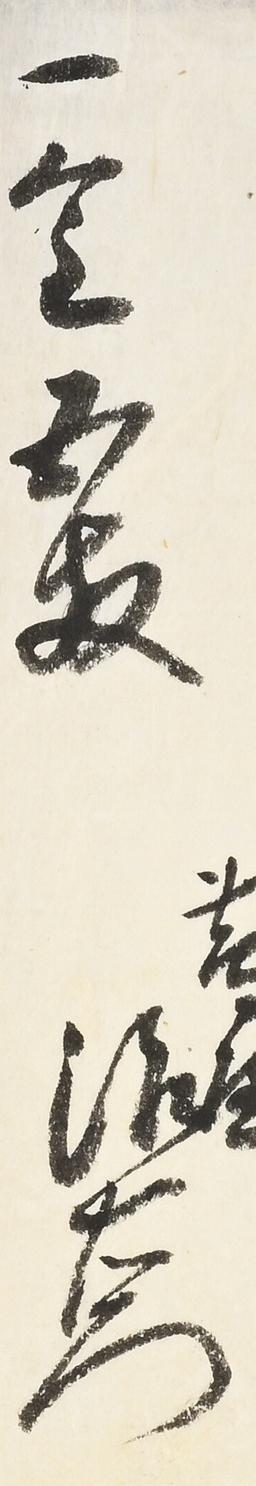一金五両治右衛門
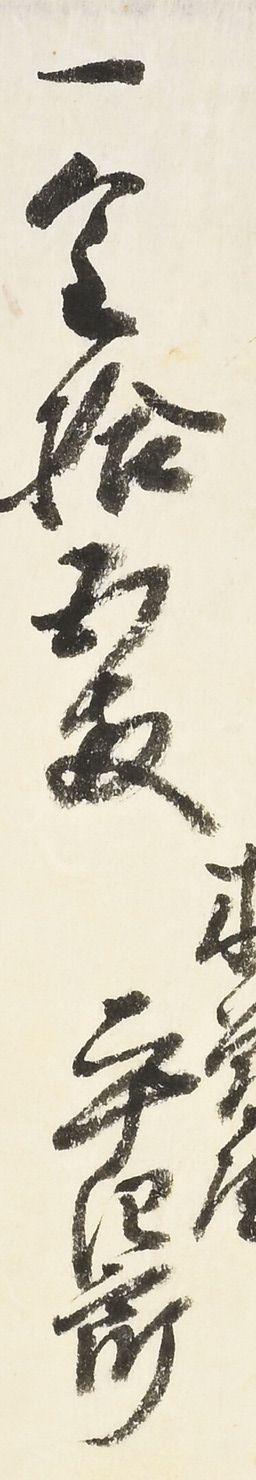一金拾五両平四郎
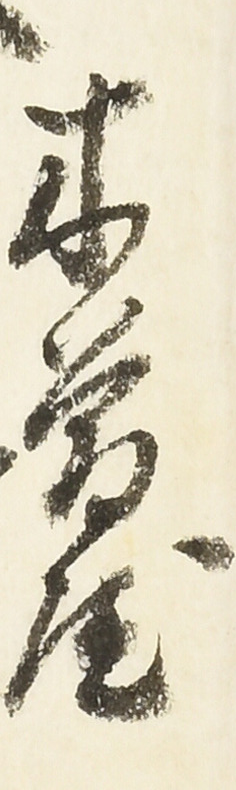木曽屋
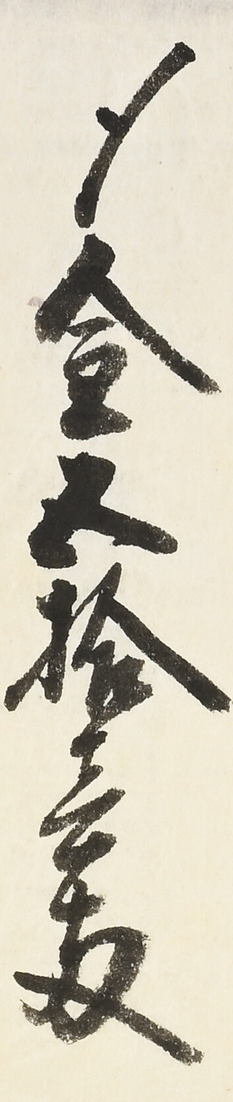〆金五拾壱両
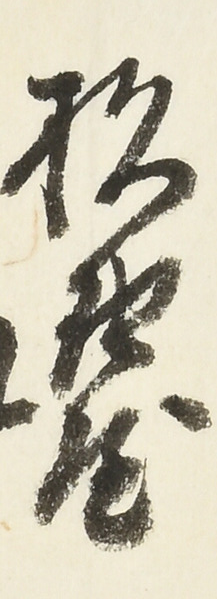杉野屋
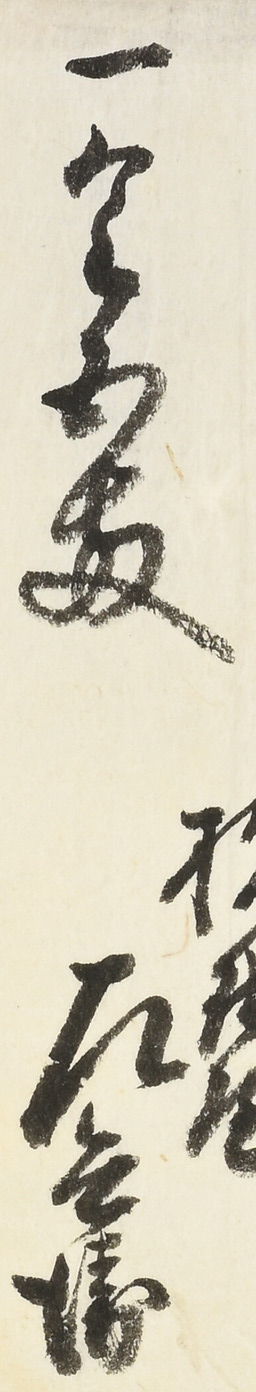一金五両左兵衛
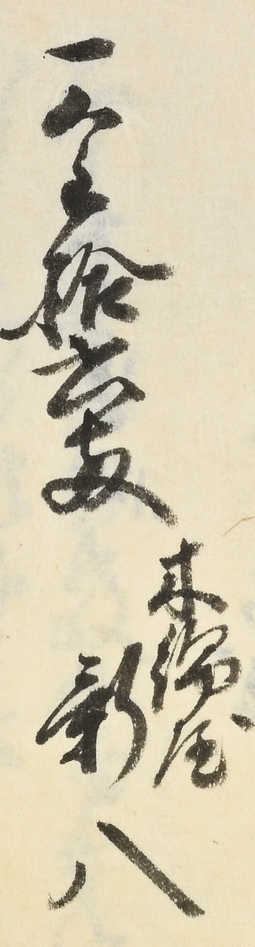一金拾六両新八

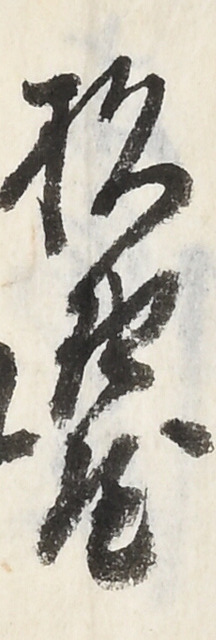杉野屋
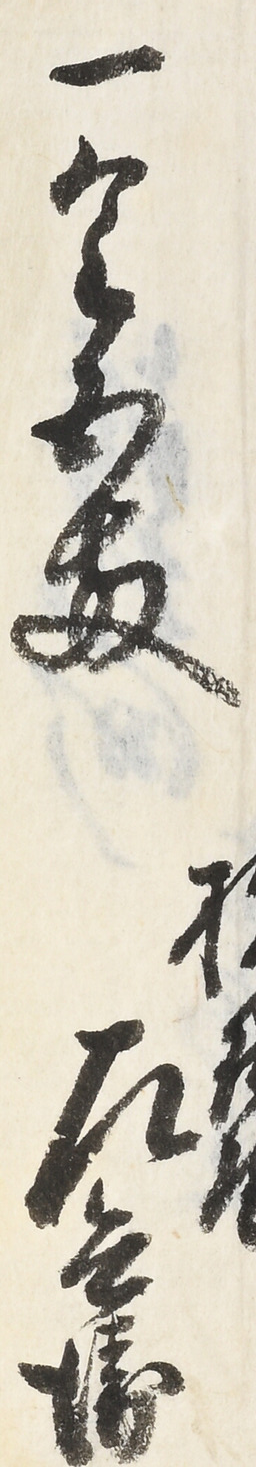一金五両左兵衛
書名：御乗出シ御才覚金割合扣帳
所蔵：伊那市立高遠町図書館・合同会社AMANE
